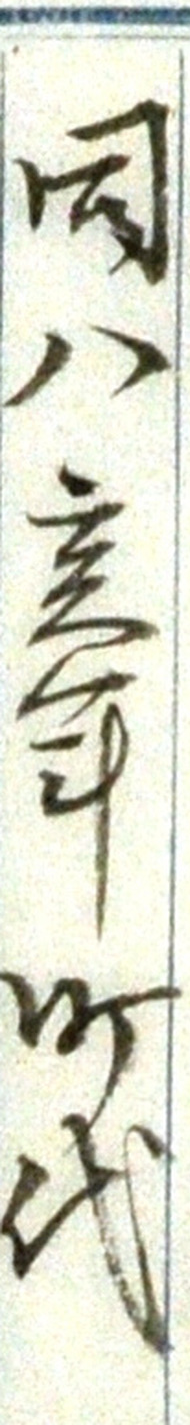同八亥年町代
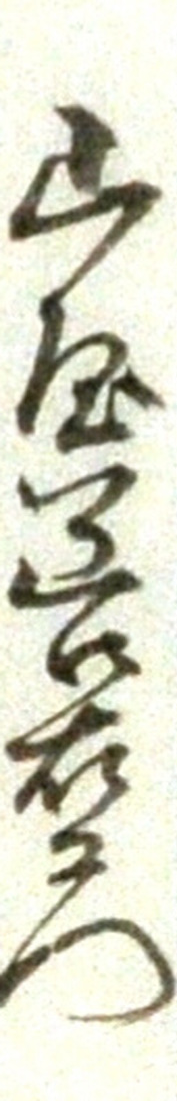山屋善右衛門
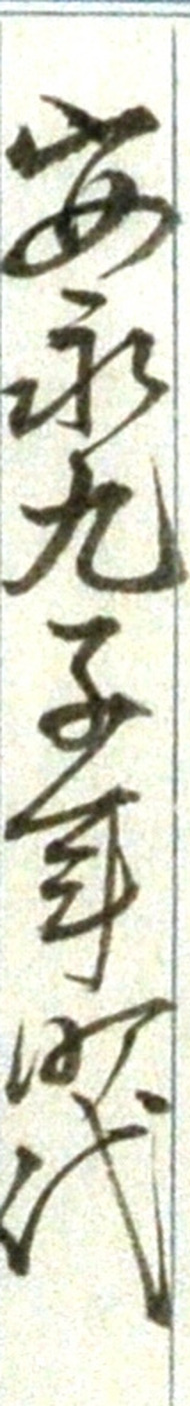安永九子年町代
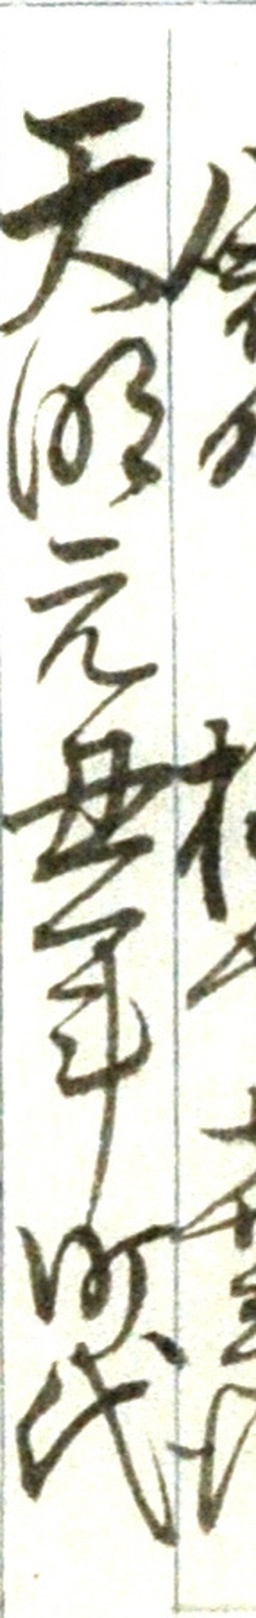天明元丑年町代

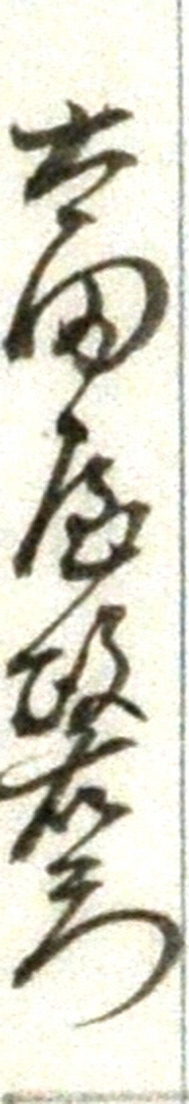太田屋政右衛門
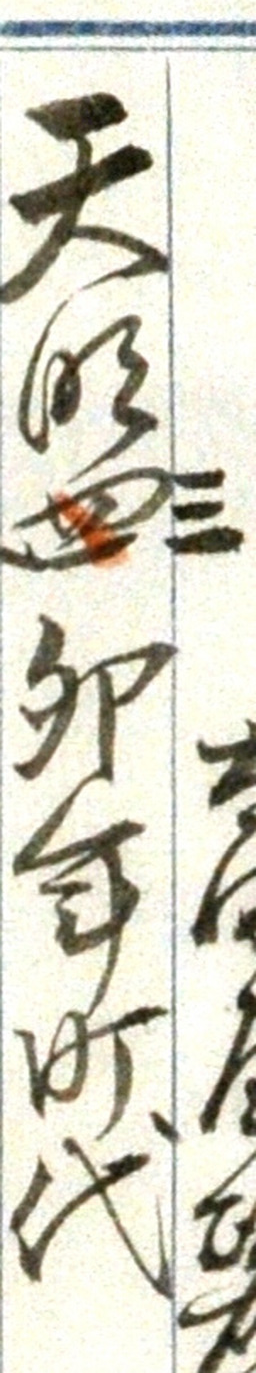天明三卯年町代
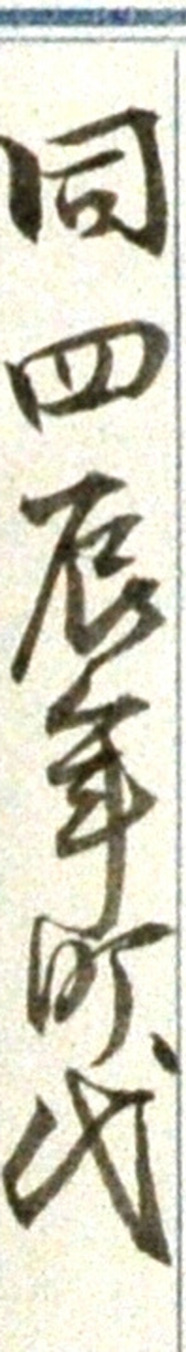同四辰年町代
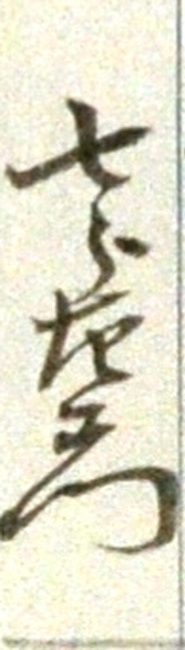七郎左衛門
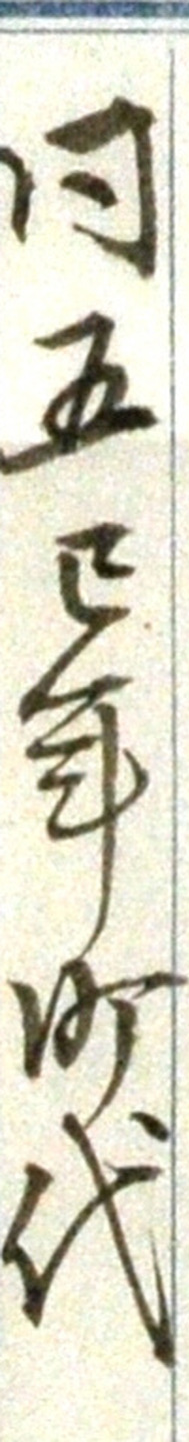同五巳年町代
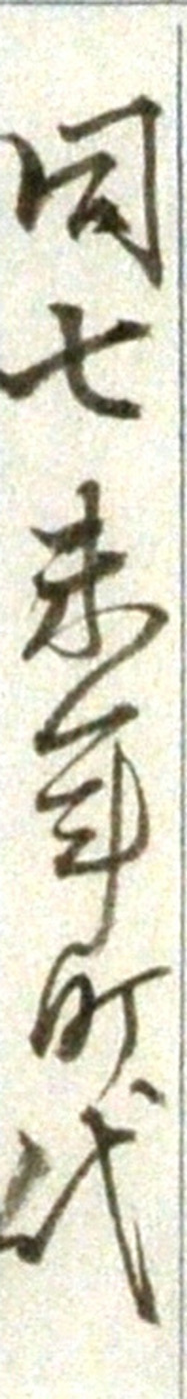同七未年町代
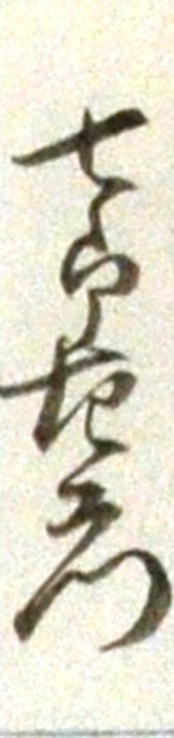七郎左衛門
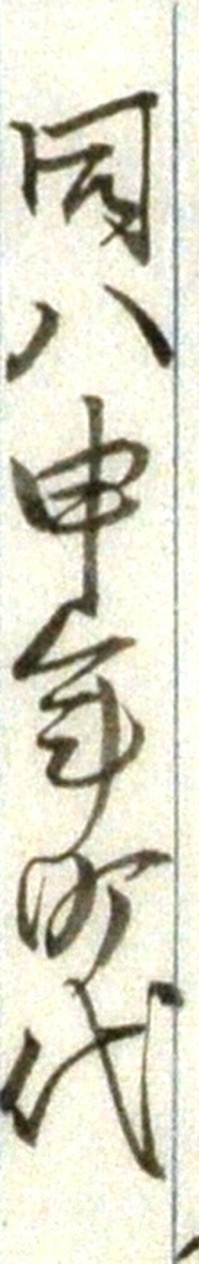同八申年町代
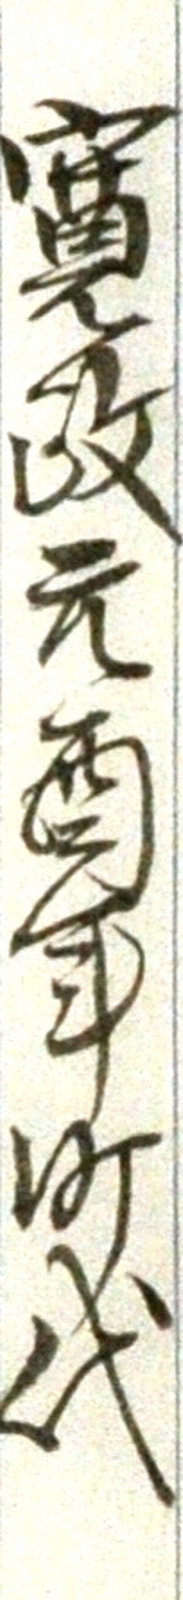寛政元酉年町代

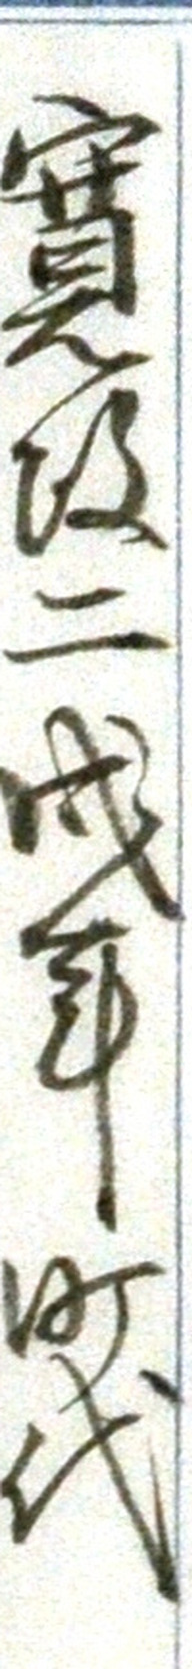寛政二戌年町代
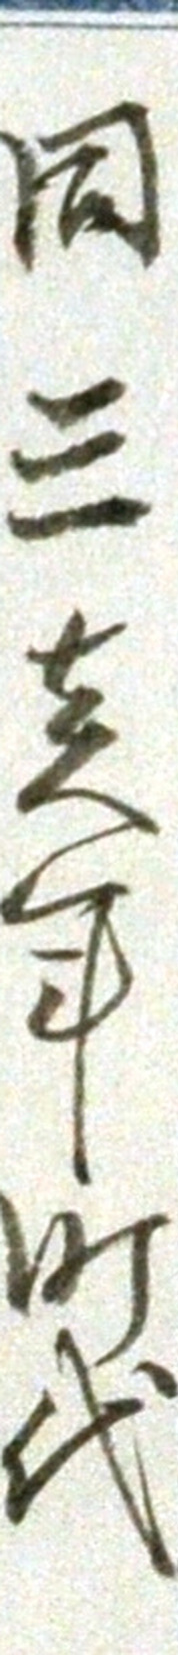同三亥年町代
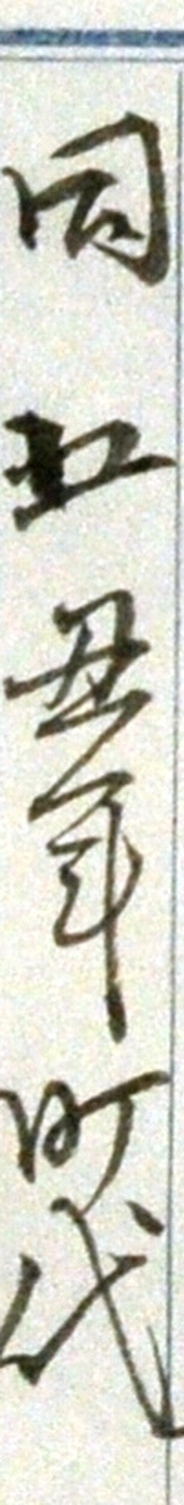同五丑年町代
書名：町方町代名前書
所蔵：伊那市立高遠町図書館・合同会社AMANE
